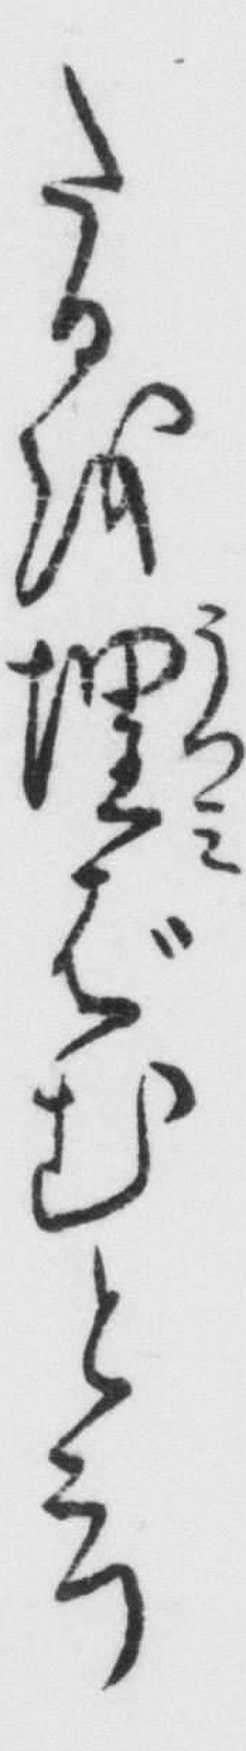たるを埋ばむと云
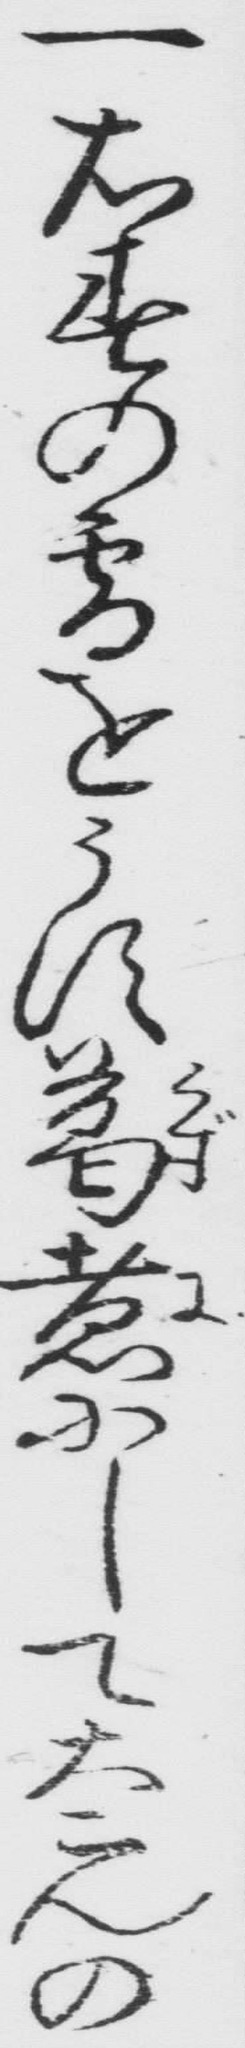一右春の雪をうす葛煮にして大こんの
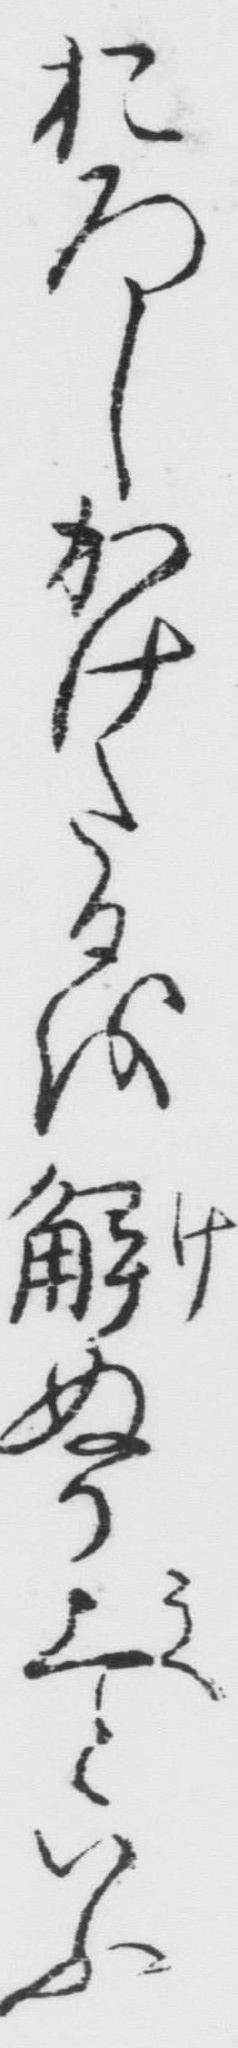おろしかけたるを解ぬか上といふ
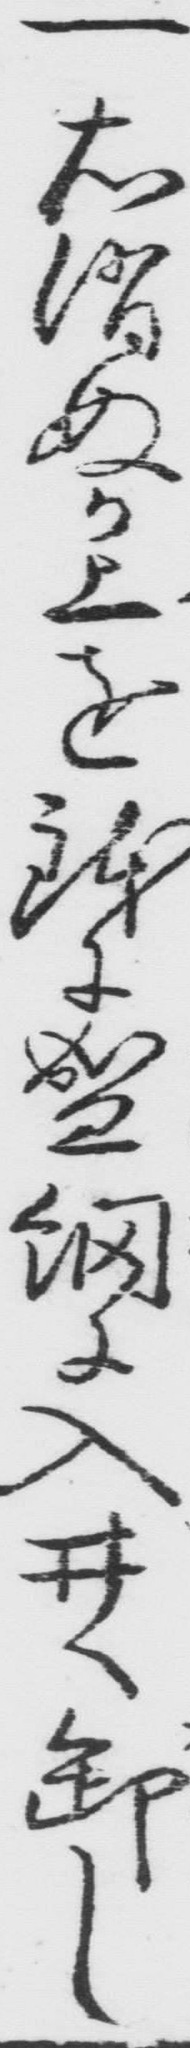一右消ぬか上を鉢に盛網に入井へ卸し
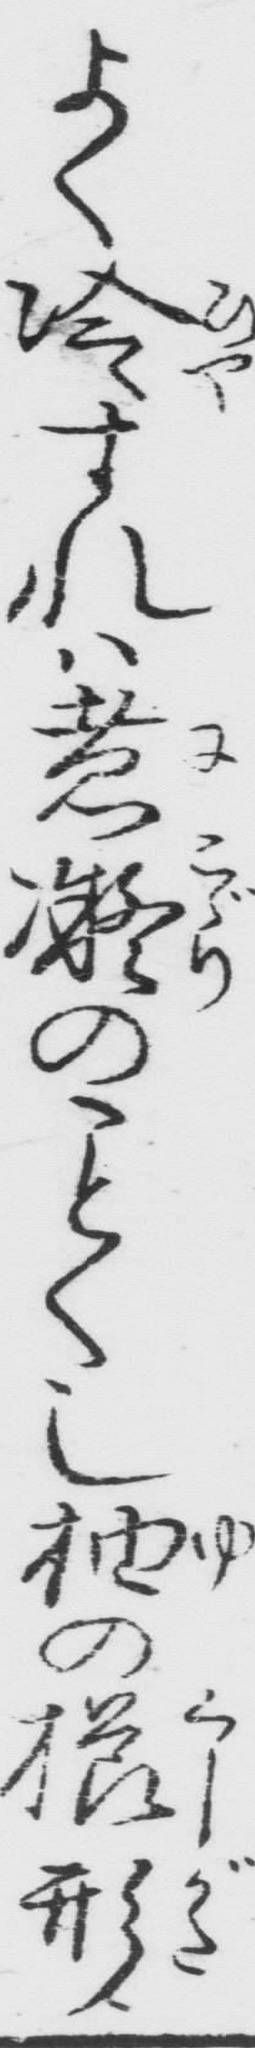よく冷すれは煮凝のことく也柚の櫛形
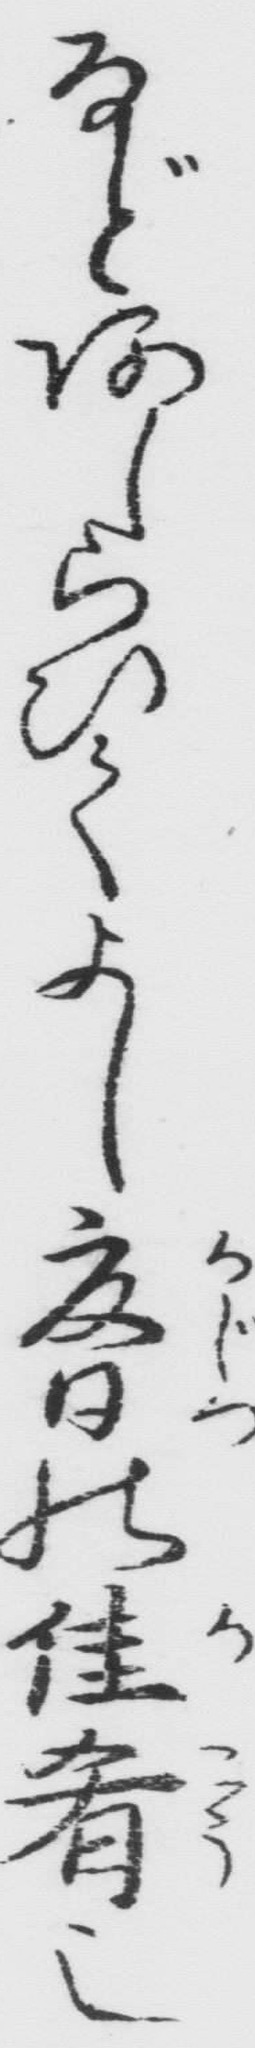などあしらひてよし夏日の佳肴也
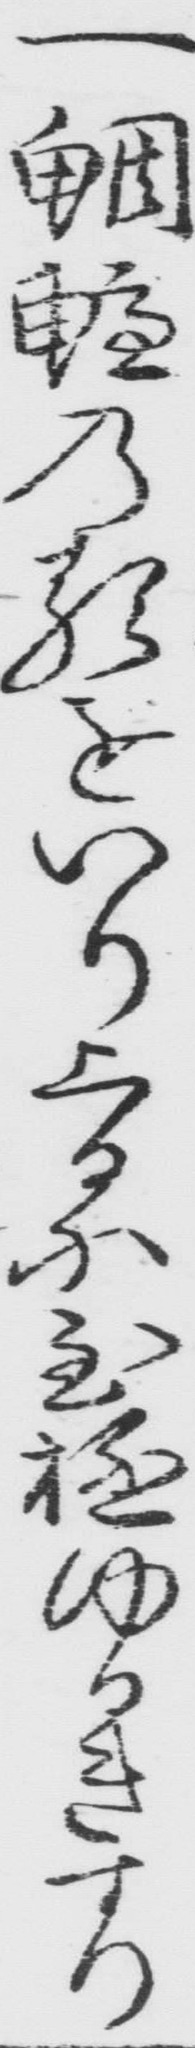一鯛鱸の類をいり上るに至極ゆるきすり
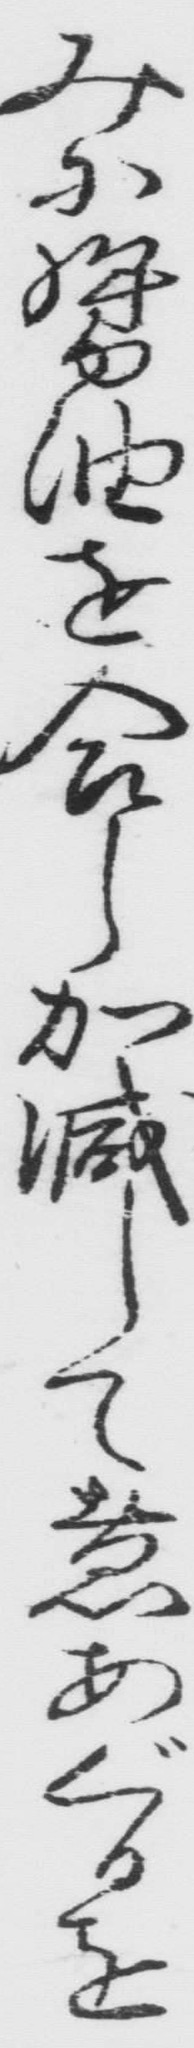みに醤油を合し加減して煮あぐるを

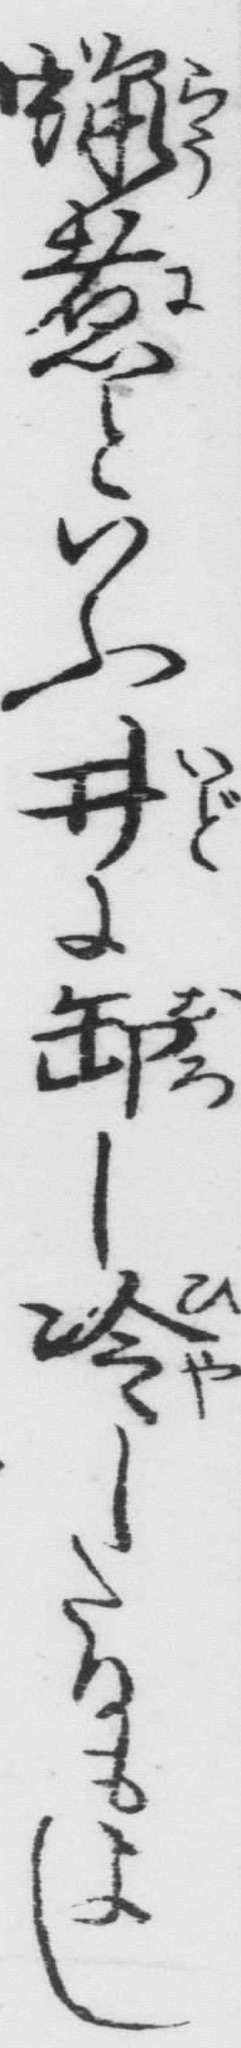蝋煮といふ井に卸し冷したるもよし
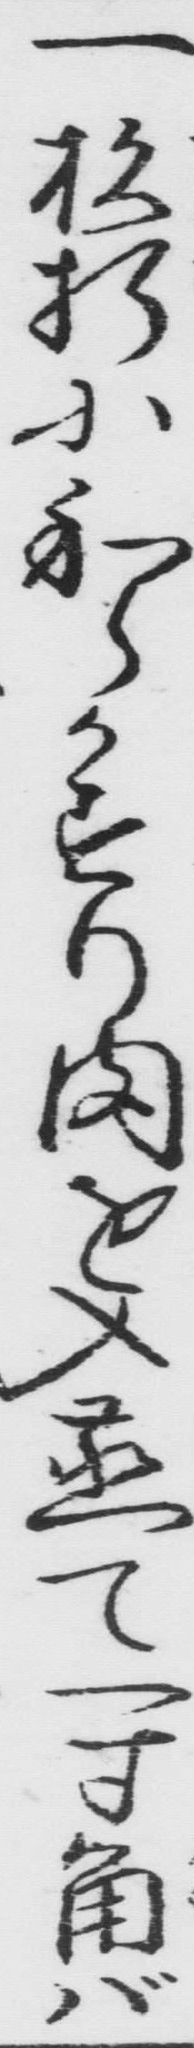一杦折に和らかすり肉を入蒸て一寸角ば
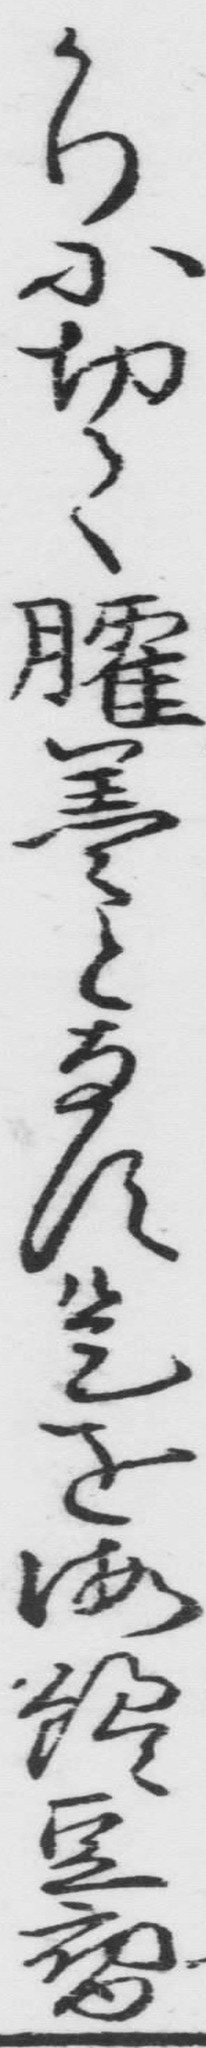かりに切て臛羹となす是を海鱧豆腐
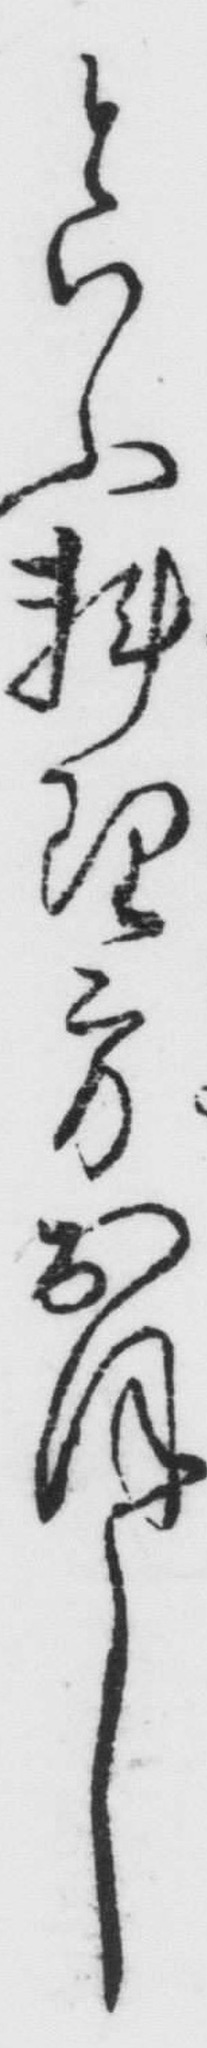といふ料理方おほし
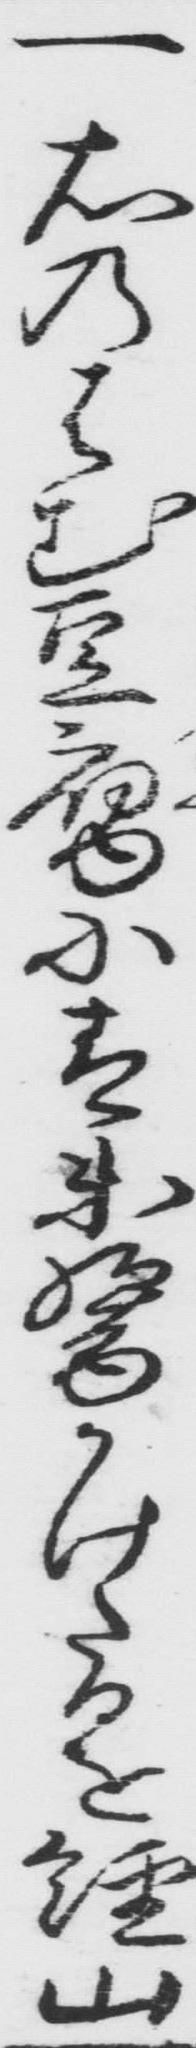一右のはむ豆腐に青未醤かけたるを経山
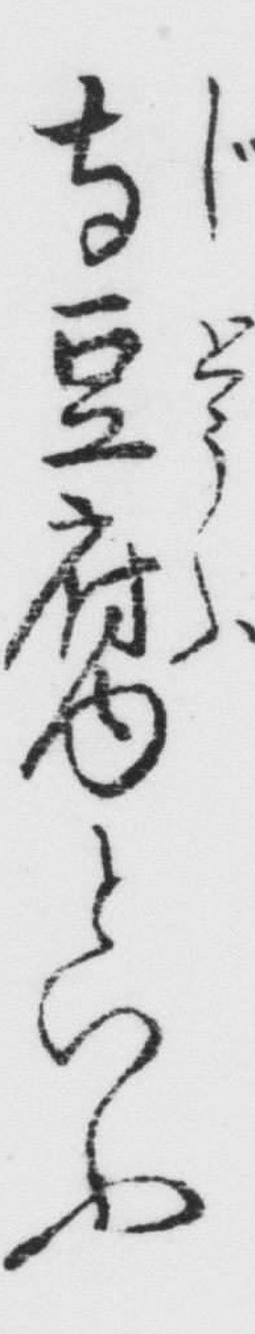寺豆腐といふ
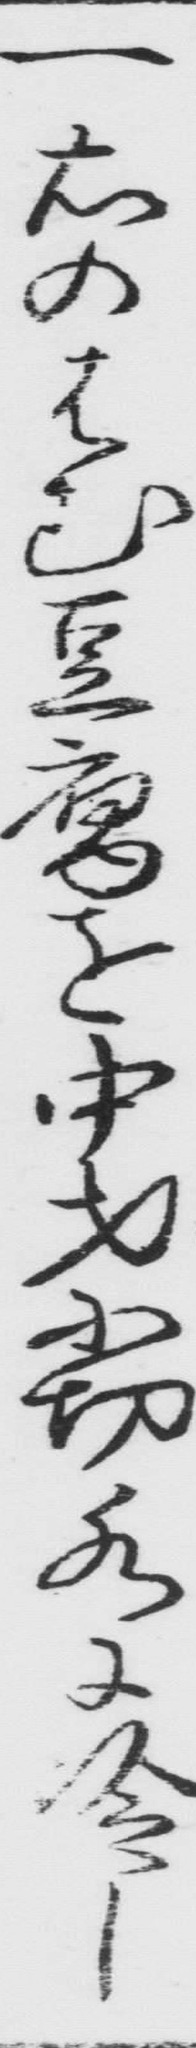一右のはむ豆腐を中才に切水に冷し
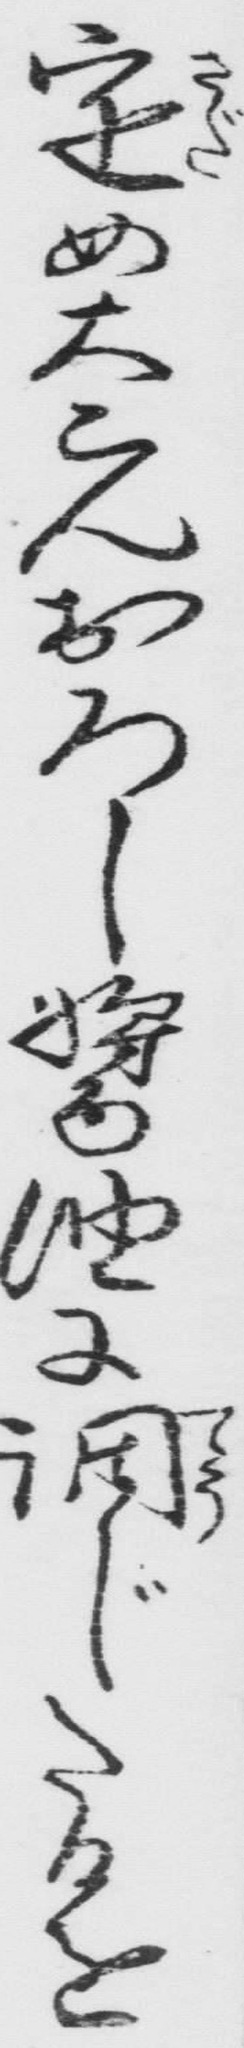定め大こんおろし醤油に調じたるを
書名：海鰻百珍
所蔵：大阪府立大学学術情報センター 国文学研究資料館
